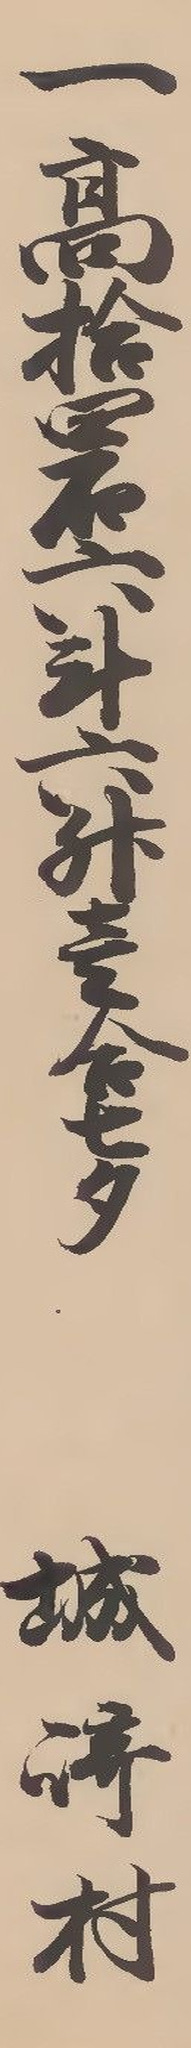一高拾四石六斗六升壱合七勺城崎村
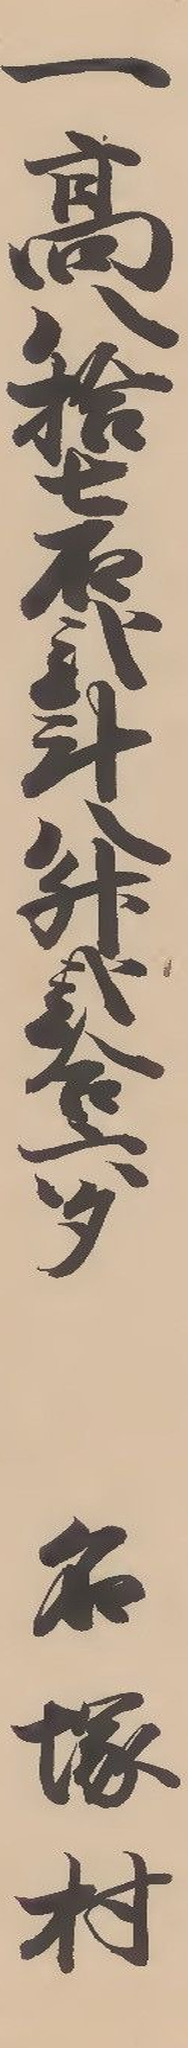一高八拾七石弐斗八升弐合六勺名塚村
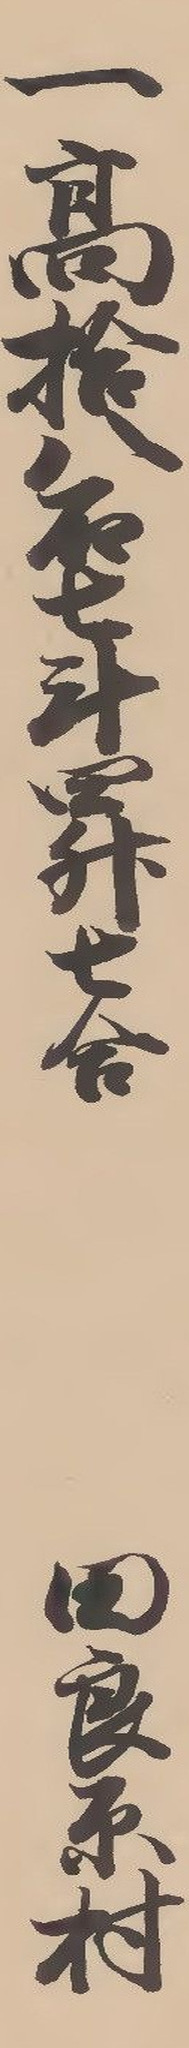一高拾八石七斗四升七合田良原村
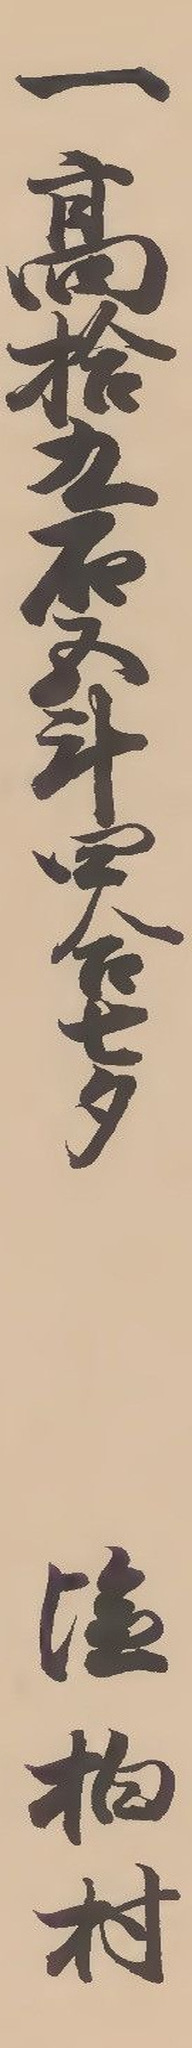一高拾九石五斗四合七勺塩柏村

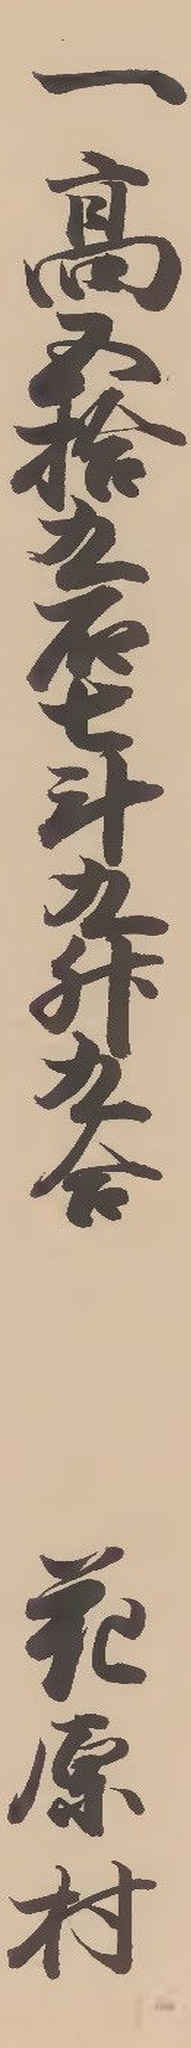一高五拾九石七斗九升九合花原村
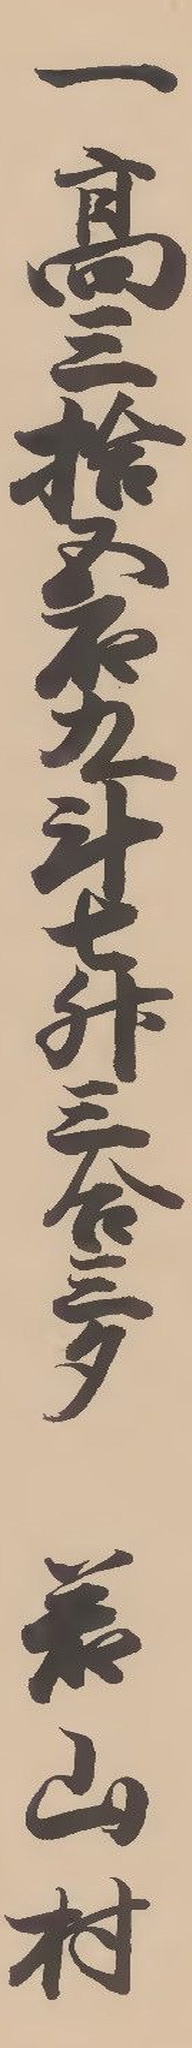一高三拾五石九斗七升三合三勺若山村
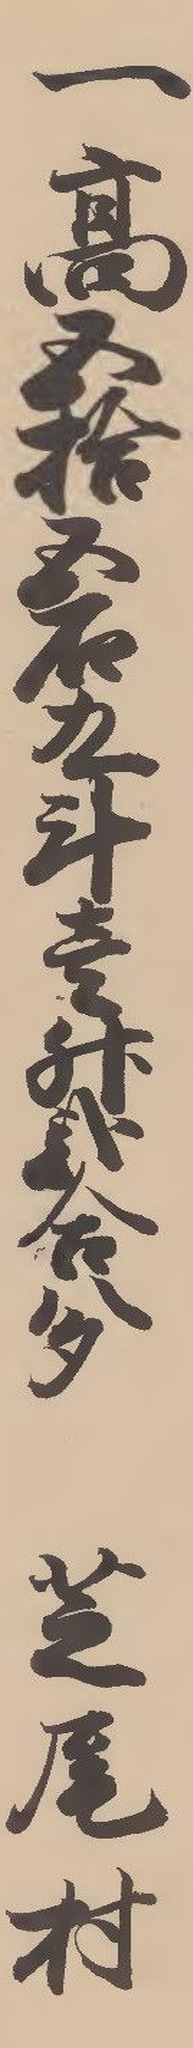一高五拾五石九斗壱升弐合八勺芝尾村
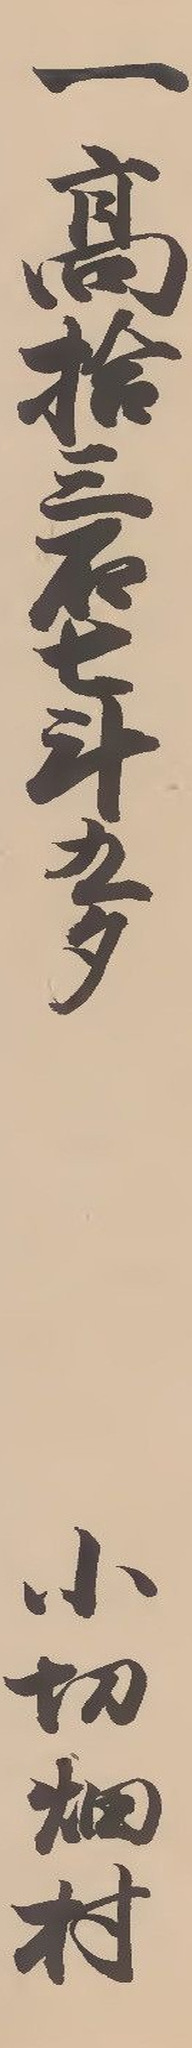一高拾三石七斗九勺小切畑村
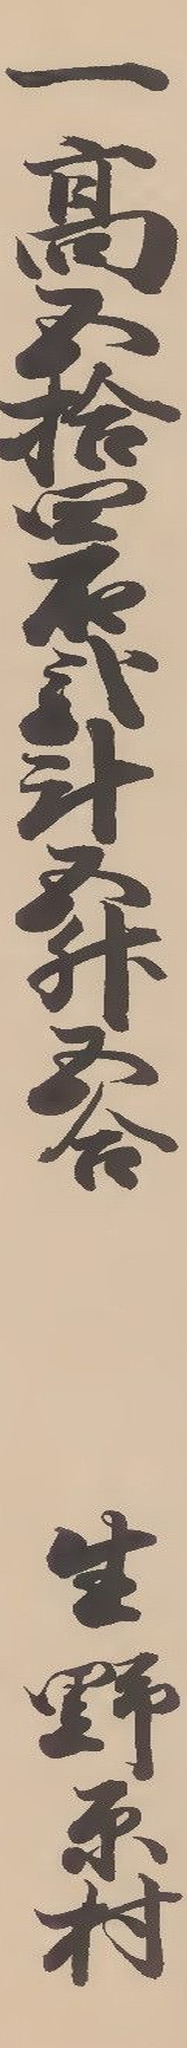一高五拾四石弐斗五升五合生野原村
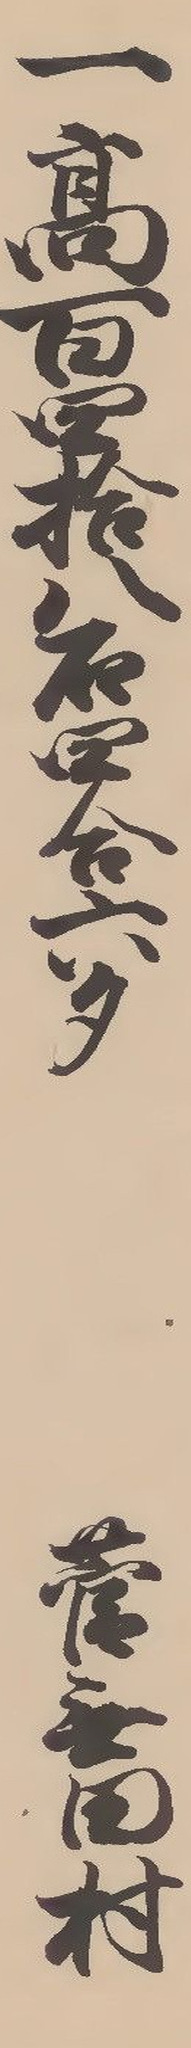一高百四拾八石四合六勺菅無田村
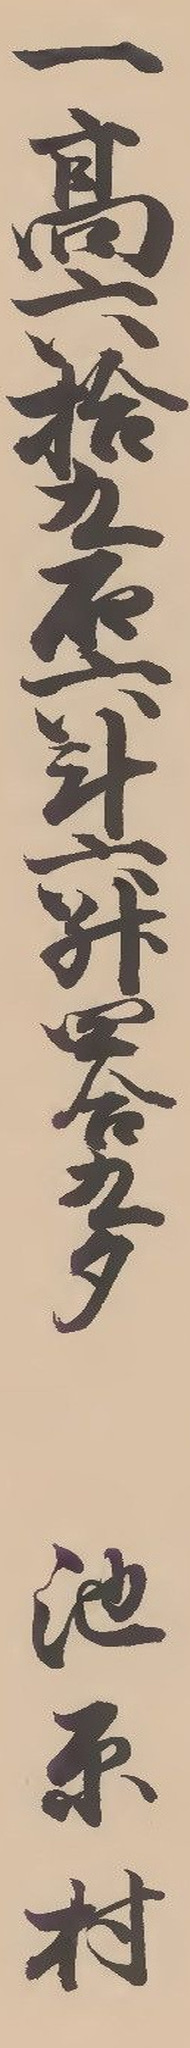一高六拾九石六斗六升四合九勺池原村

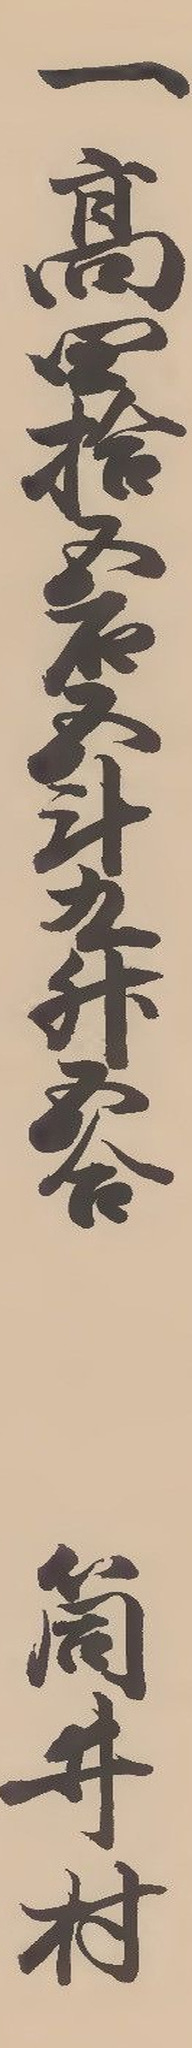一高四拾五石五斗九升五合筒井村
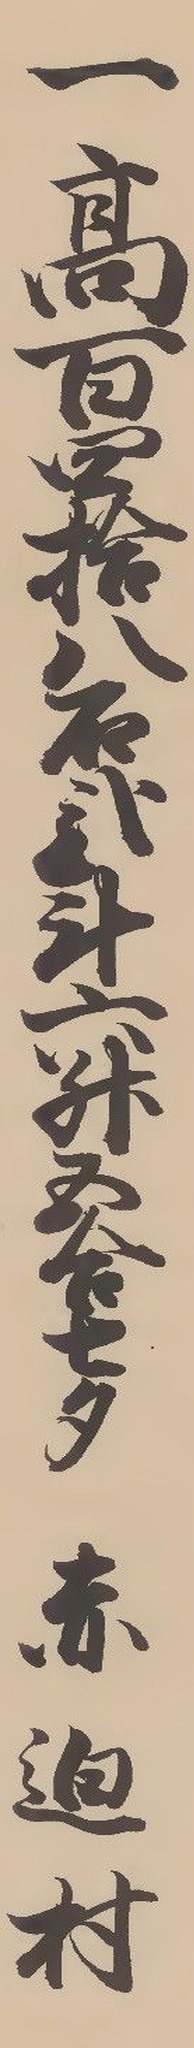一高百四拾八石弐斗六升五合七勺赤迫村
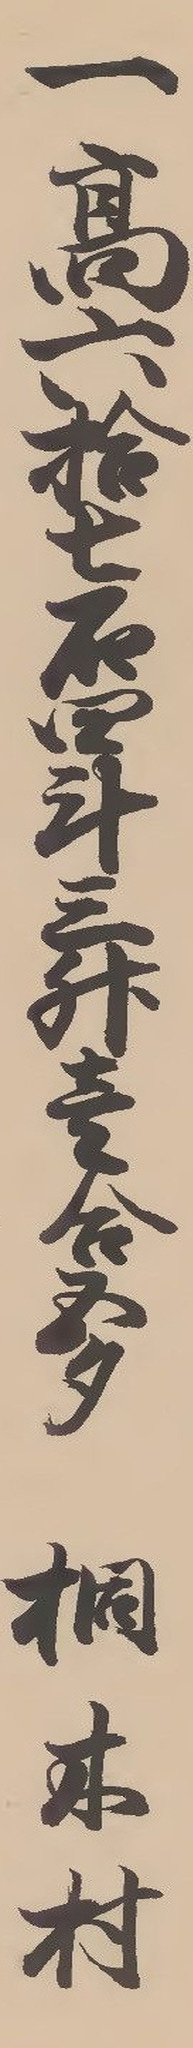一高六拾七石四斗三升壱合五勺桐木村
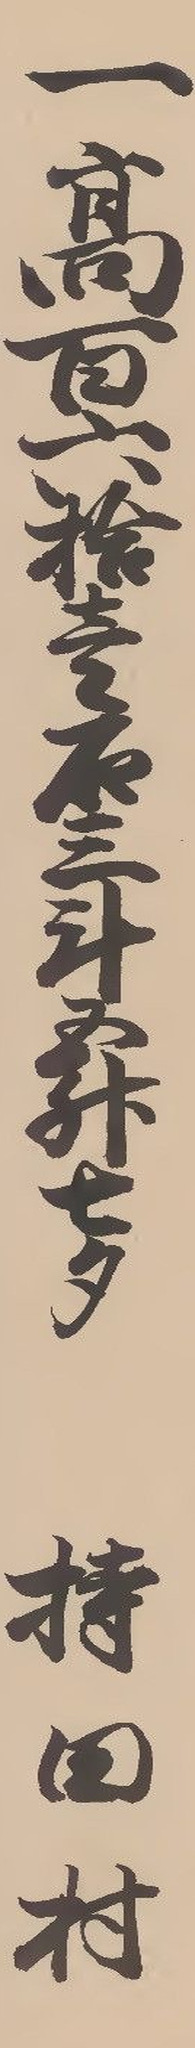一高百六拾壱石三斗五升七勺持田村
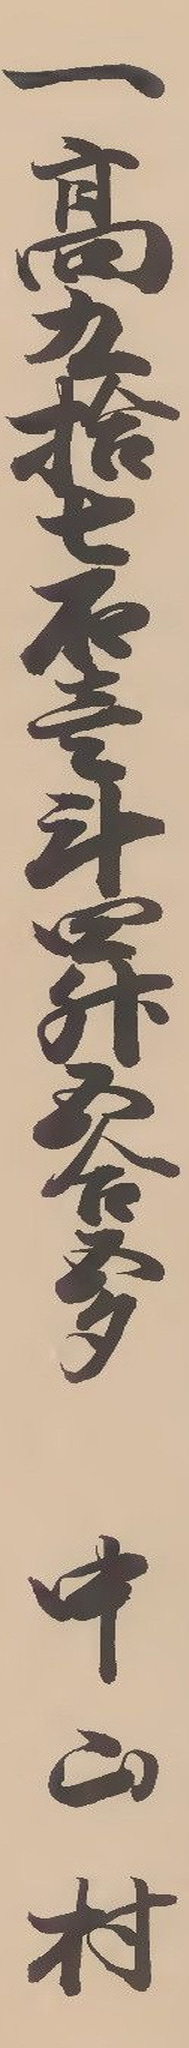一高九拾七石壱斗四升五合五勺中山村
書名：豊後国郷帳
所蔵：国立公文書館 National Archives of Japan
